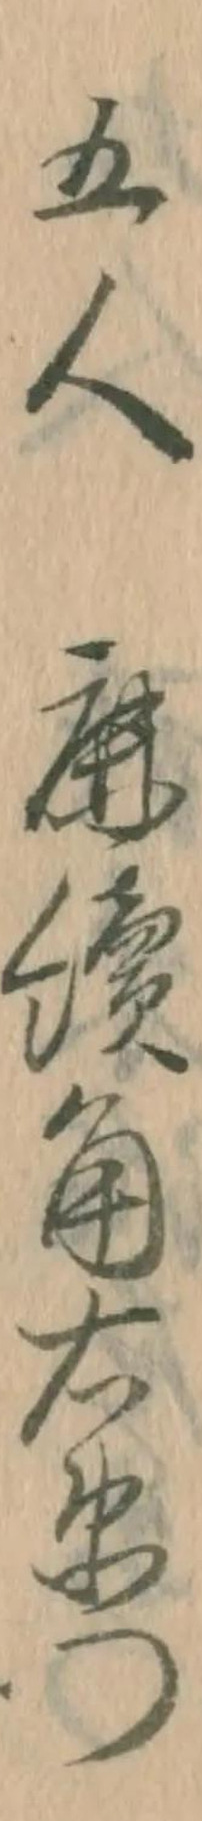五人片桐忠右衛門
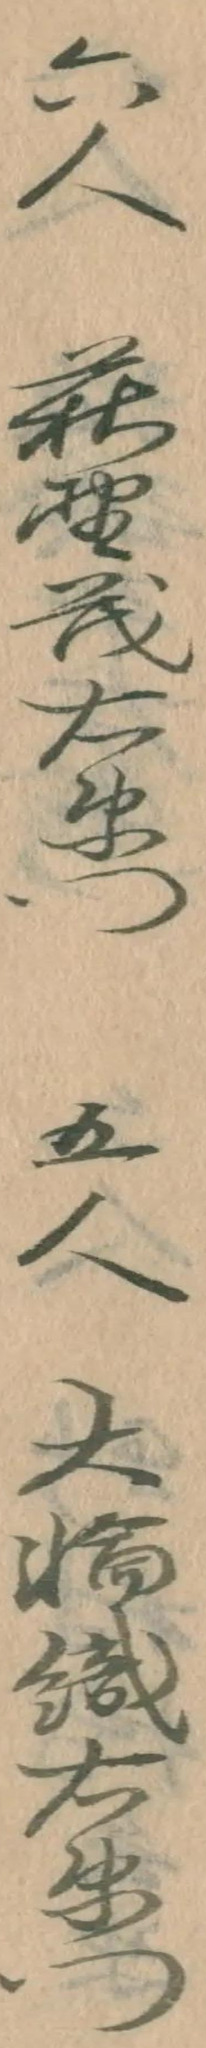六人萩野茂右衛門五人大輪織右衛門
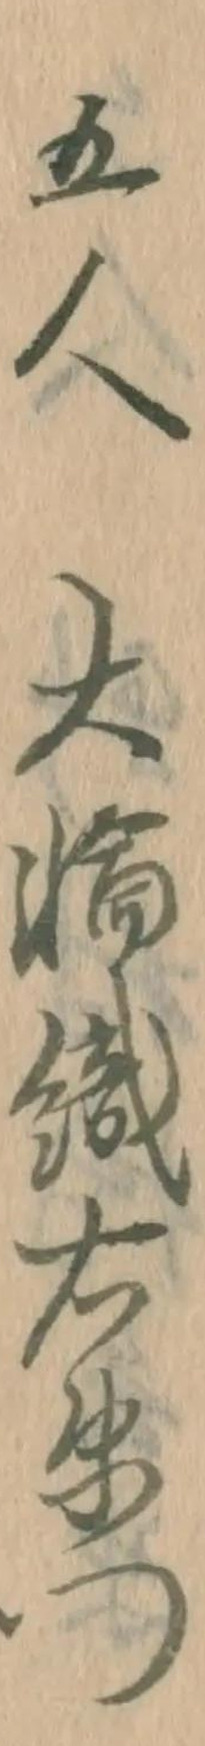五人片桐忠右衛門
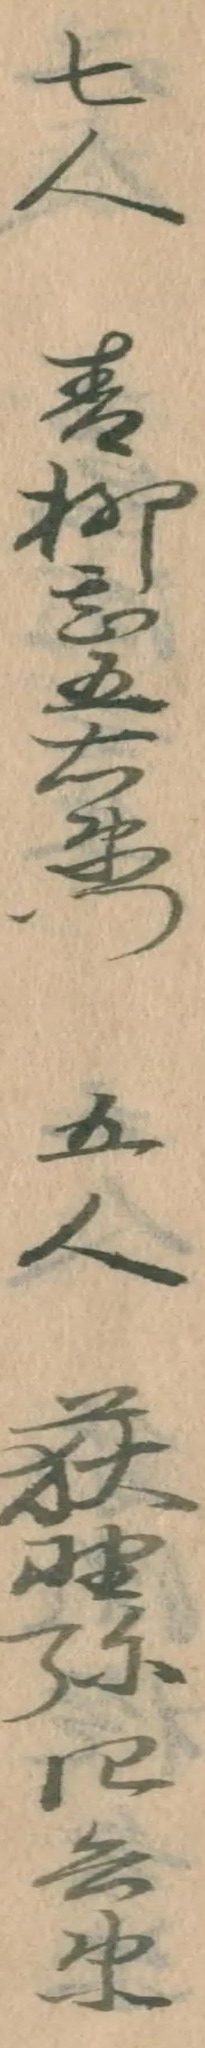七人青柳甚五右衛門五人荻野弥四兵衛
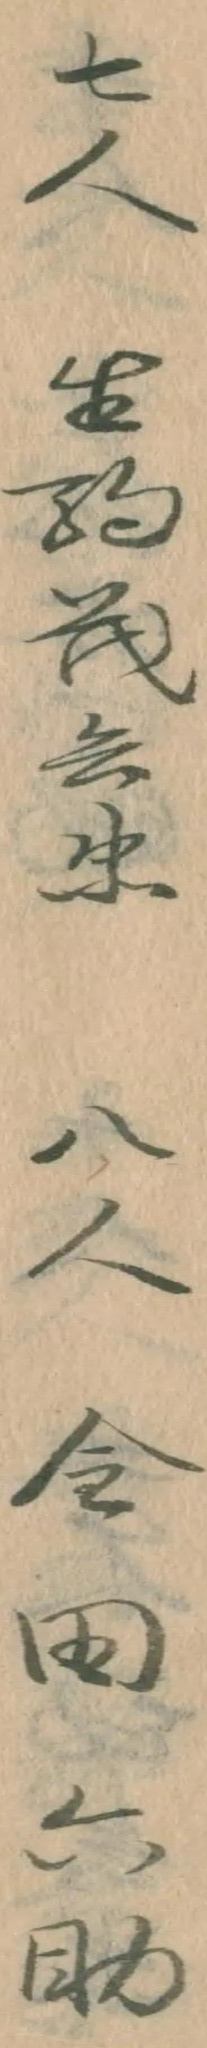七人生駒茂兵衛八人金田六助
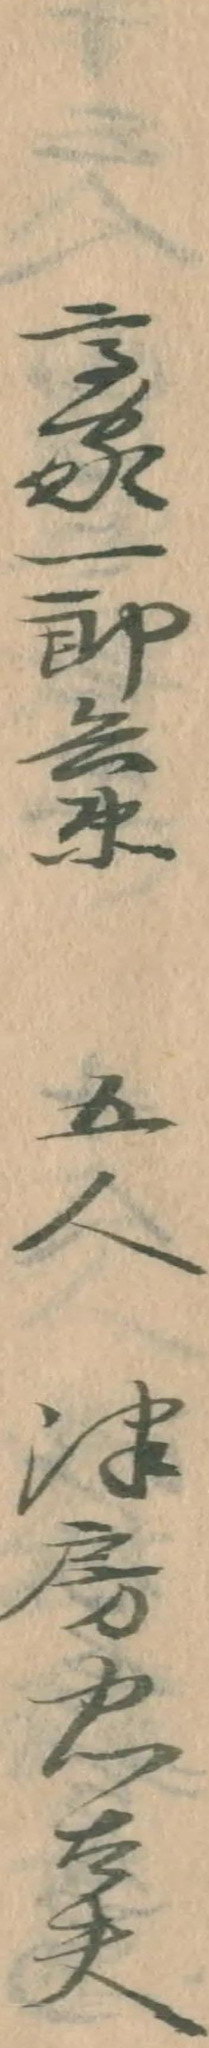高家一郎兵衛五人津房忠太夫
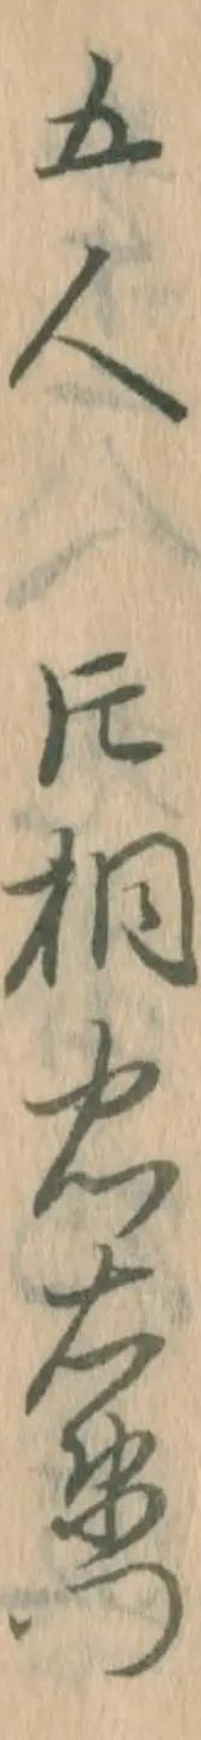五人片桐忠右衛門
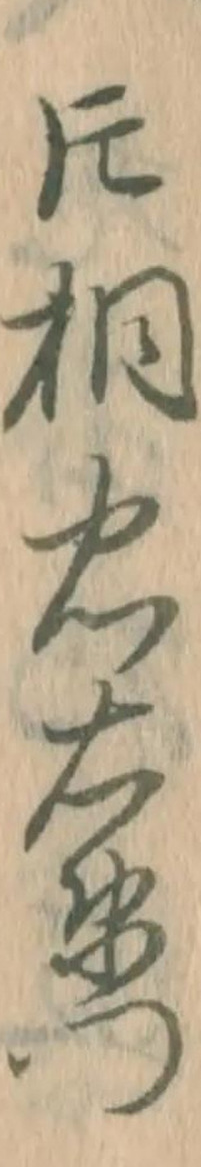五人片桐忠右衛門
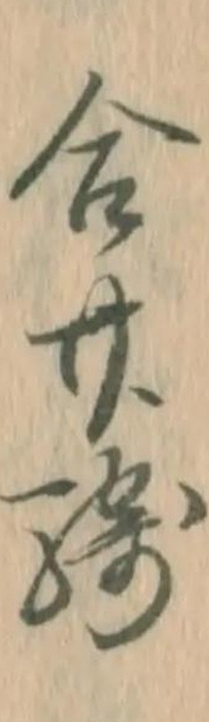合廿騎

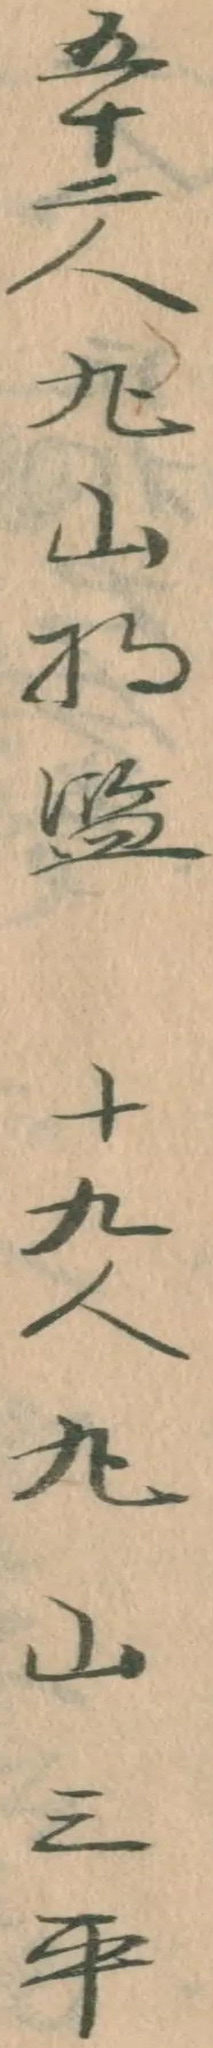五十二人丸山物監十九人丸山三平
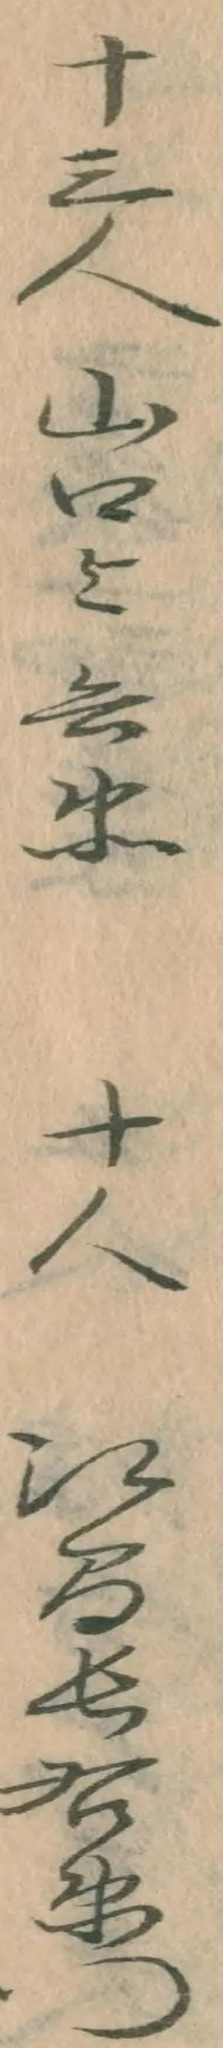十三人山口与兵衛十人江間長右衛門
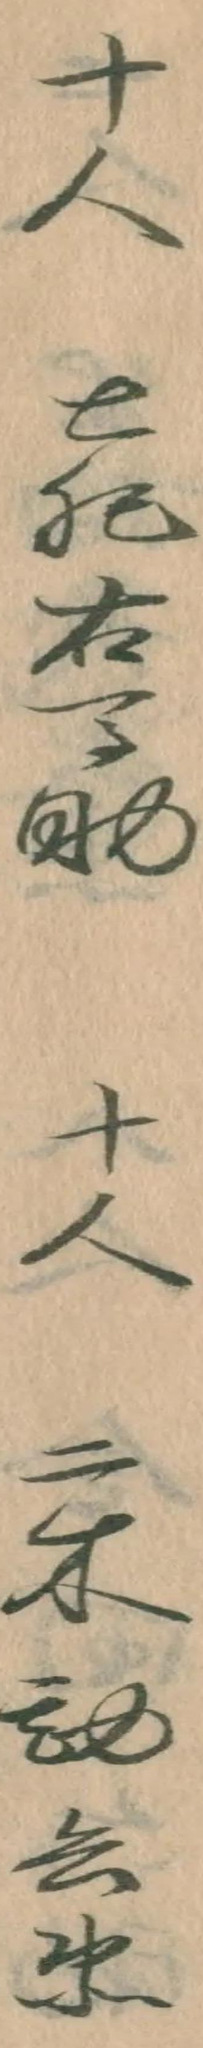十人土肥右馬助十人二木勘兵衛
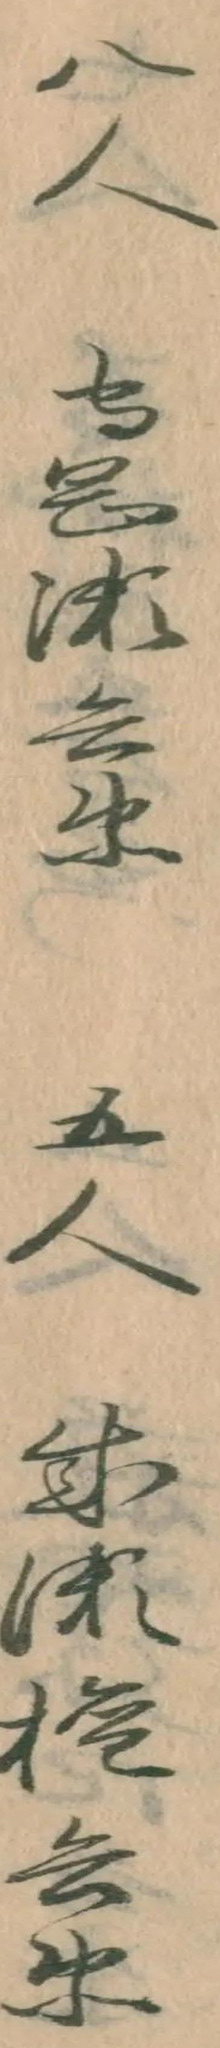八人寺岡沈兵衛五人成瀬権兵衛
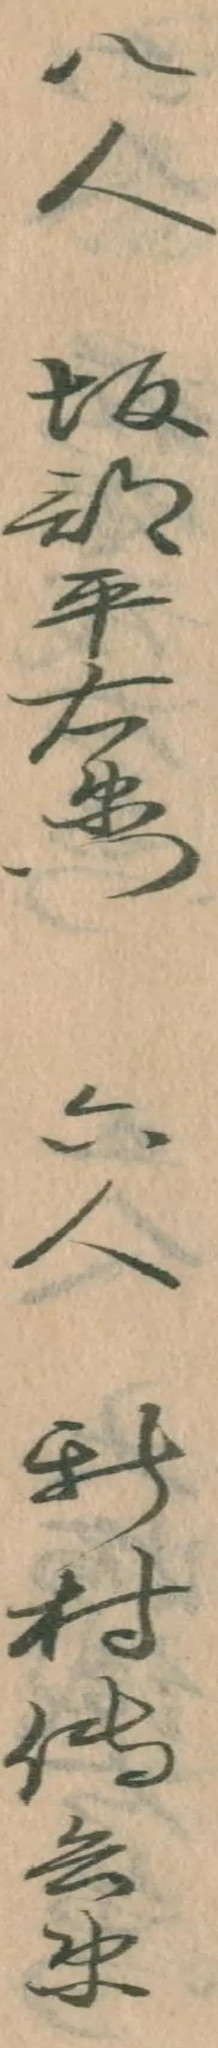八人坂部平右衛門六人新村伝兵衛
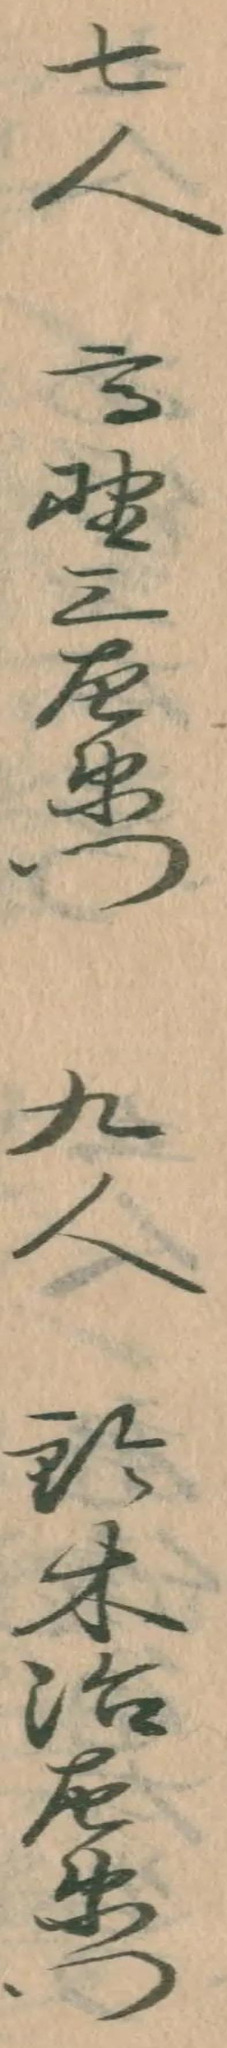七人高野三右衛門九人鈴木治左衛門
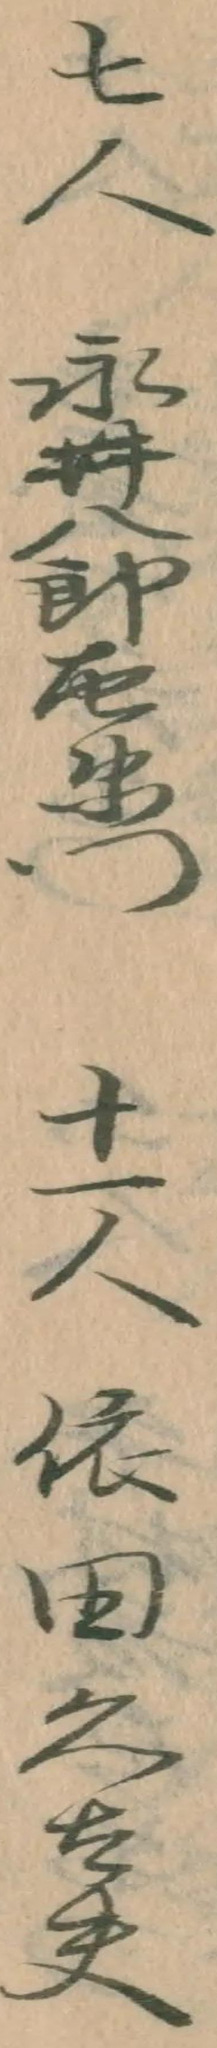七人永井八郎左衛門十一人依田久太夫
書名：切支丹御退治記 49巻. [6]
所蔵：国立国会図書館 National Diet Library, JAPAN
